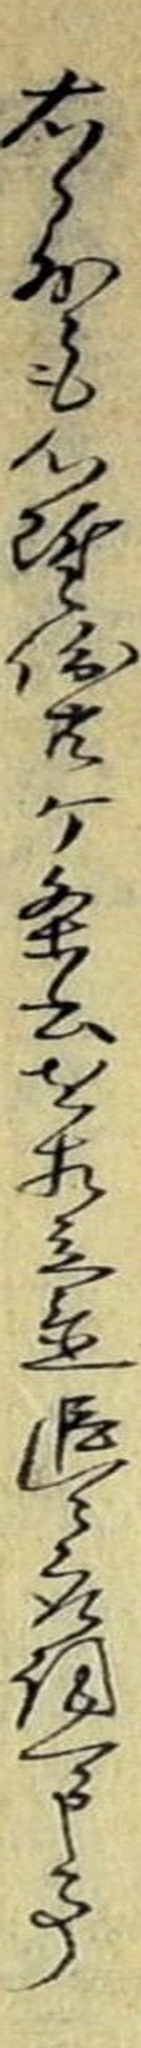右之外ニも心付候儀共ケ条書を相立置追々取調可申事
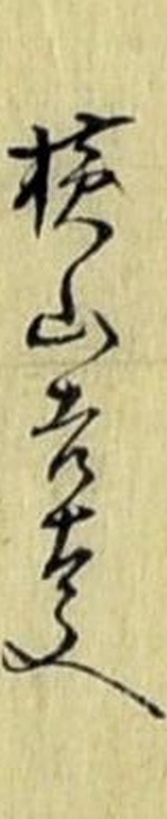横山吉太夫
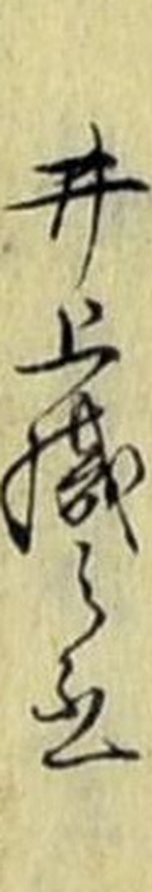井上織之丞
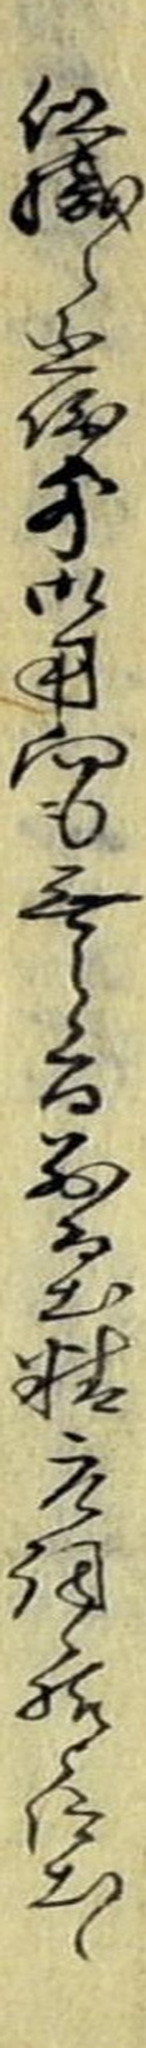但織之丞儀外御用向も無之候間別而出精取調候様被仰出候
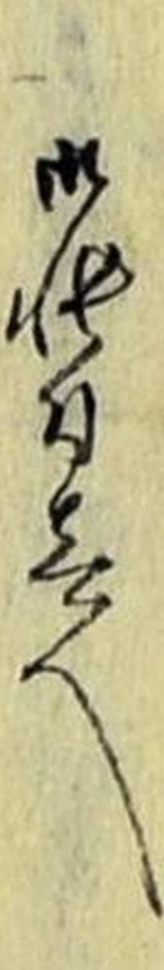御帳付壱人
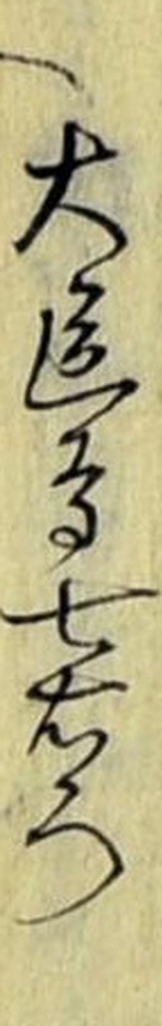大道寺七右衛門

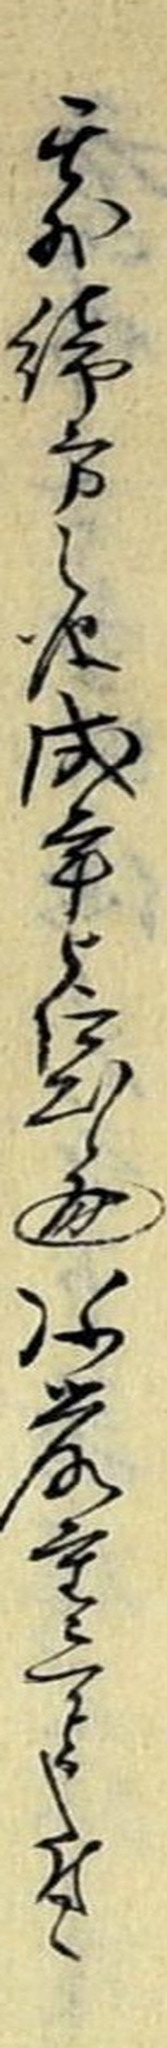其外締方之儀戌年被仰出候通弥厳重ニ可被申付候
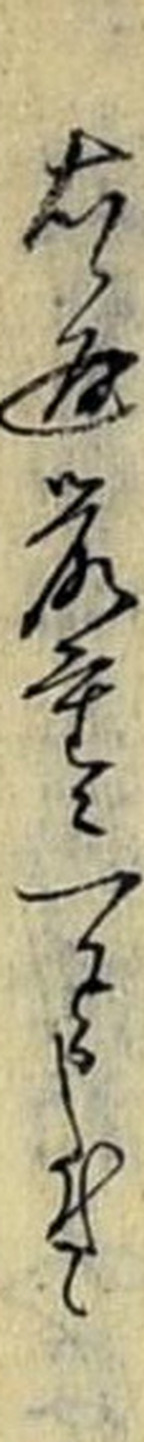右之通厳重ニ可被申付候
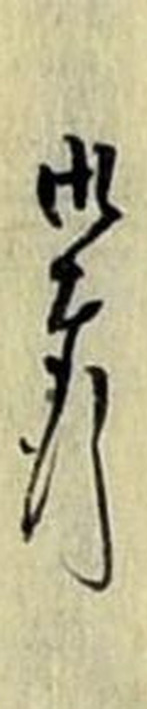御奉行
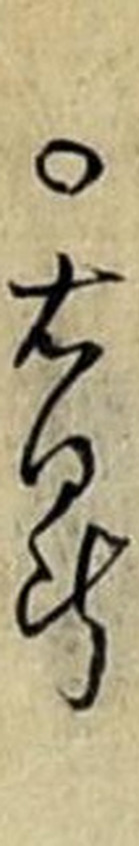〇右同断
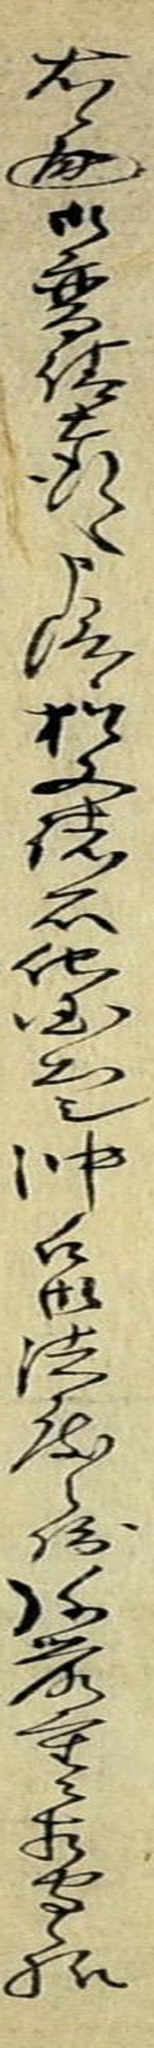右之通御普請奉行へ申渡候猶又諸所他国出シ沖ノ口御法度之儀弥厳重ニ相守候様
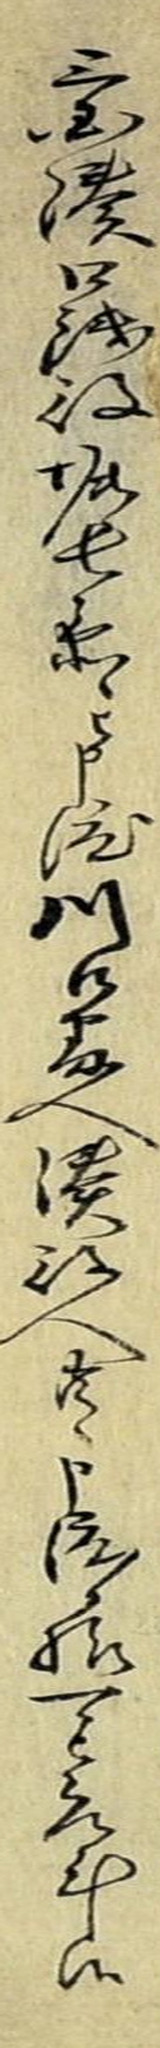三国湊口銭役堀長兵衛へ被申渡川口番人湊役人共へ申渡候様可被取計候
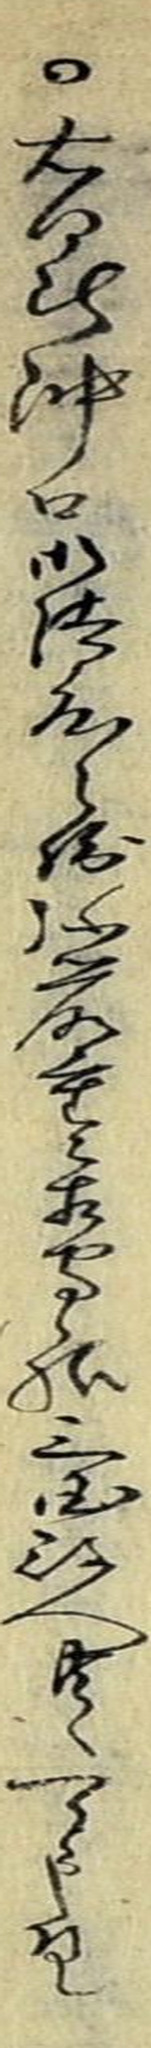〇右同断沖ノ口御法度之儀弥厳重ニ相守候様三国役人共へ可被申付候
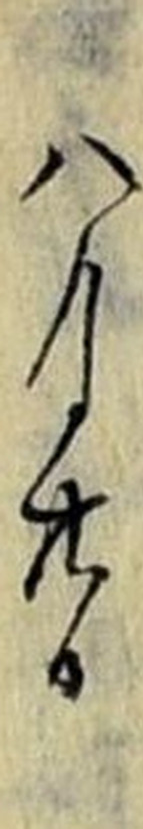八月廿日
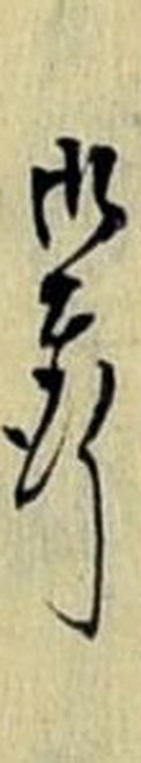御奉行
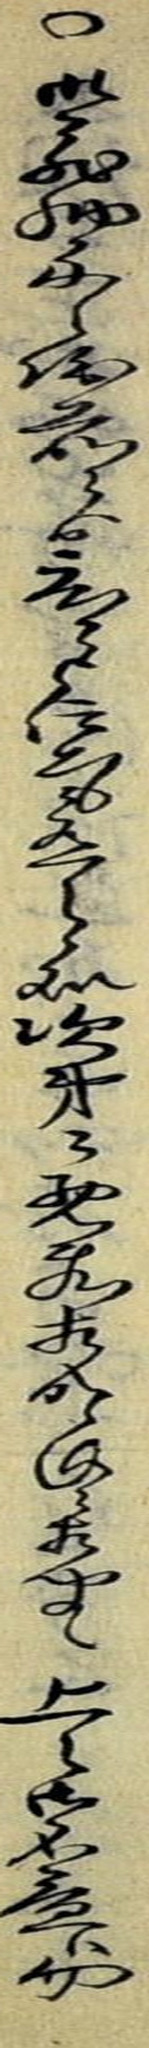〇御蔵納米之儀前々ゟ度々被仰出も有之候処次第ニ悪敷相成候趣ニ相聞候上之御不益ハ勿
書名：命令之部 三
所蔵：福井県文書館 Fukui Prefectural Archives
